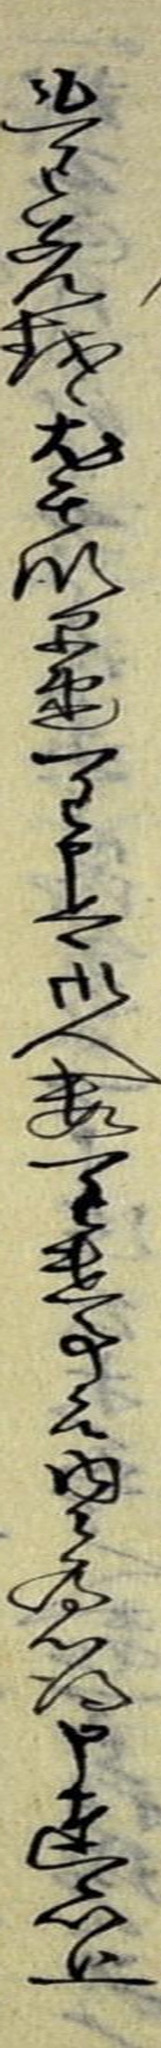も可被差越候尤其段早速可被申上候御人数可被遣事ニ候内々為心得申達候以上
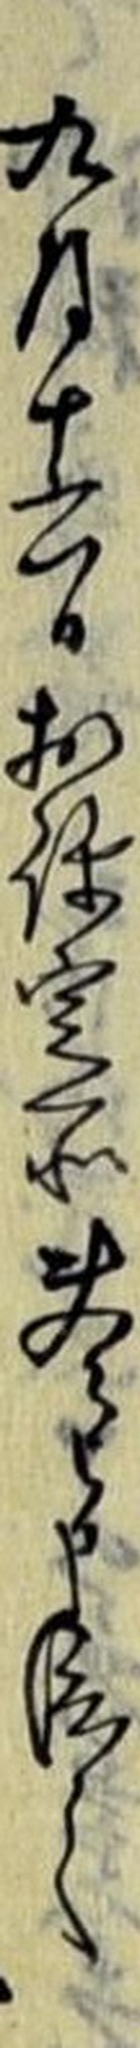九月十六日於評定所夫々被申渡之
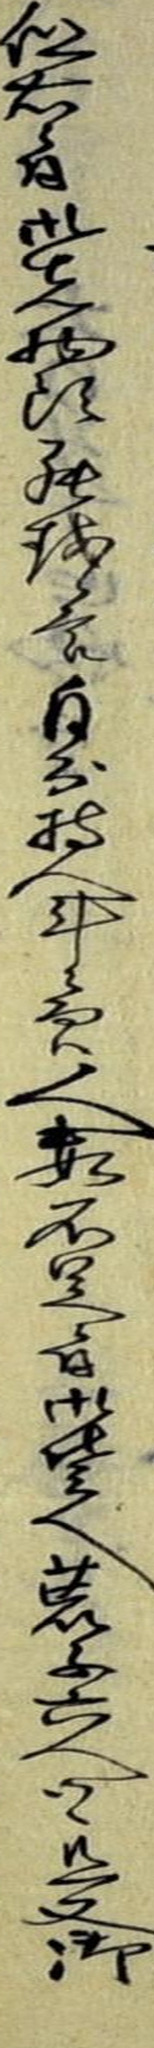但右ニ付御先物頭罷越候節自分持人斗ニ而ハ人数不足ニ付御貸人荒子六人ツヽ且又御
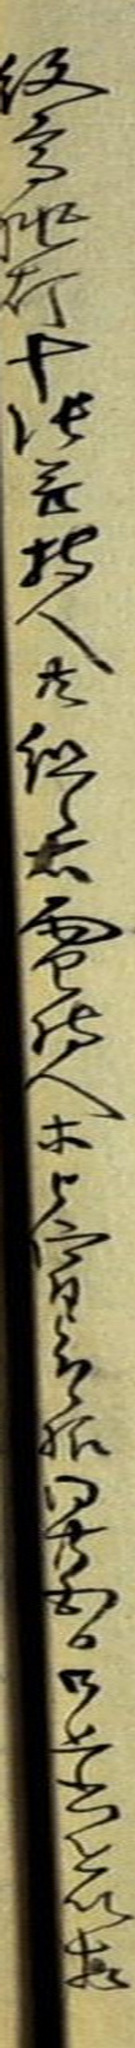役高提灯十張并持人共組之者雨具持人等被仰付被下候様同廿五日口上書を以相
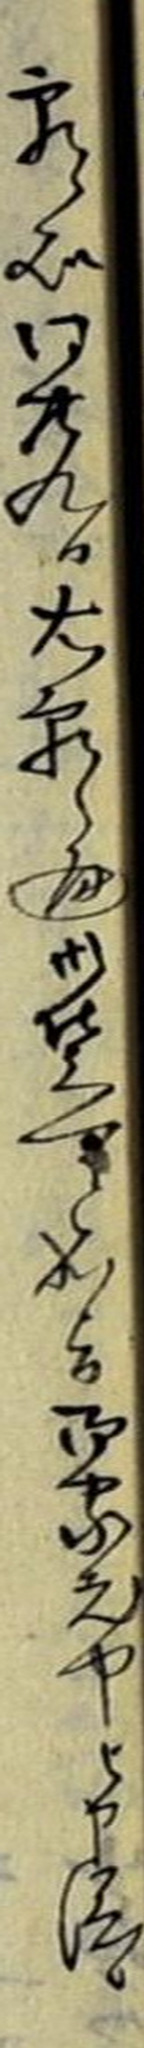願候処同廿九日右願之通御貸可被成旨御家老中被申渡候
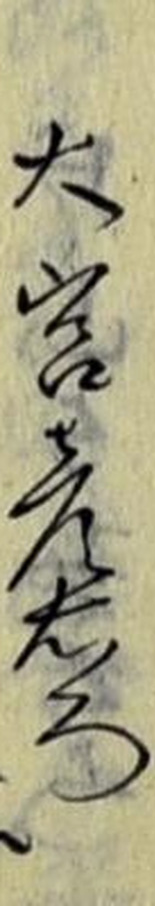大宮彦右衛門
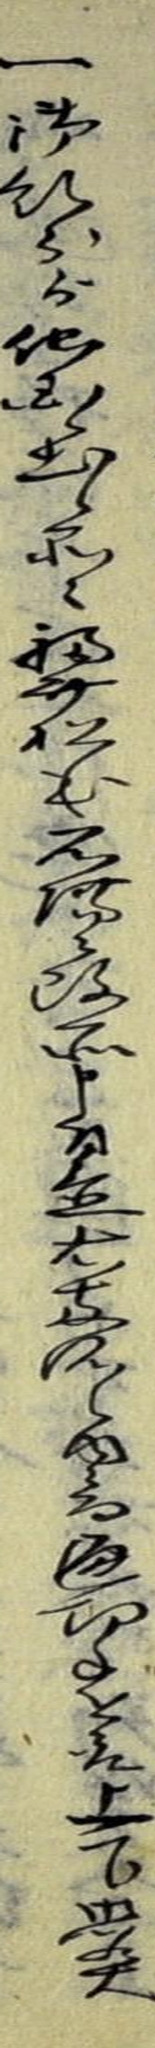一御領分ゟ他国へ出候品々福井松本石場ニ改所申付置右両所之内ニ而通切手を取上下御関
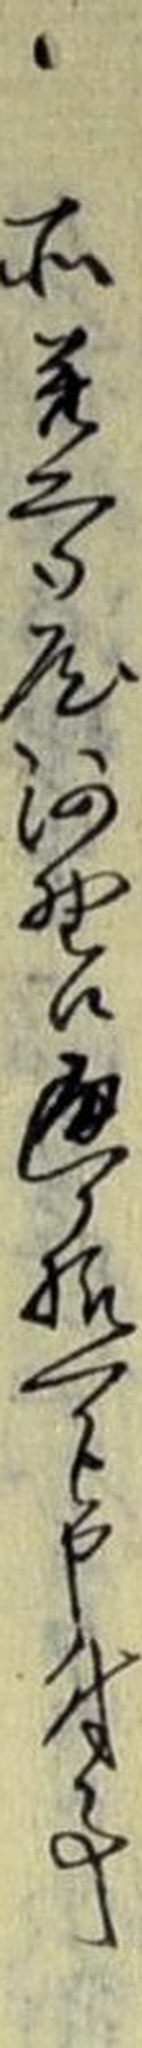所并二ツ屋河野口通候様可被申付事
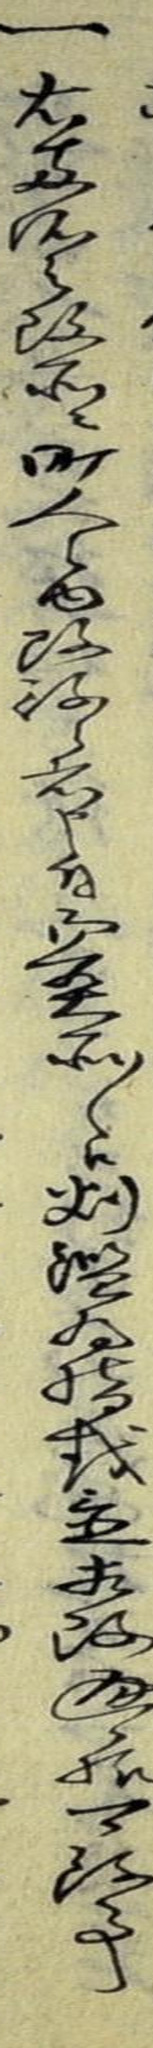一右両所之改所ニ町人之内改役之者申付御関所〳〵江判鑑為指越置相改通候様可致事
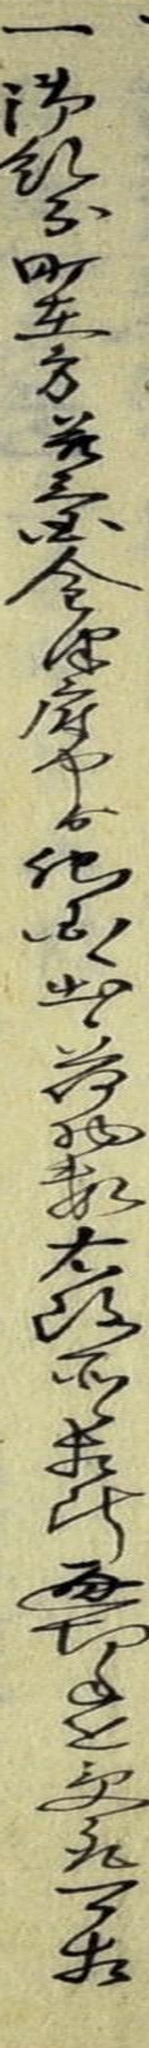一御領分町在方并三国金津府中ゟ他国へ出候荷物数右改所へ相断通切手を受取可相
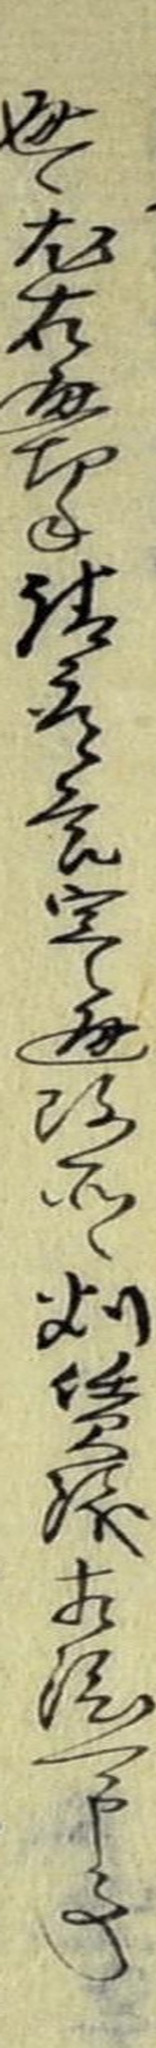通候尤右通切手請取候節定之通改所へ判賃銭相渡可申事
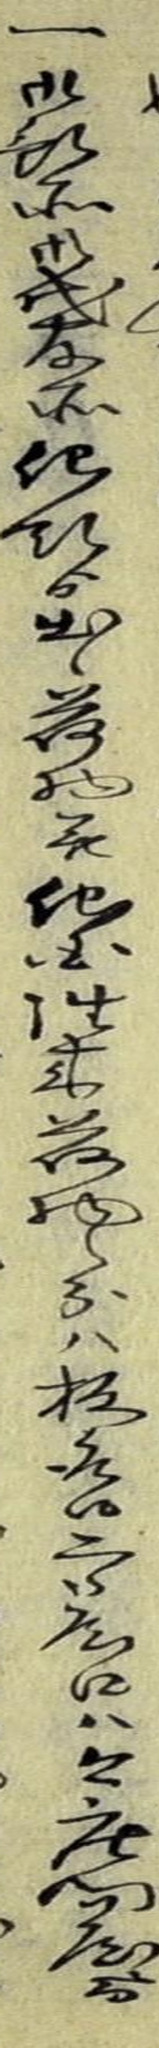一御領所御代官所他領ゟ出候荷物并他国往来荷物之分ハ板取口二ツ屋口ハ今庄問屋ニ而
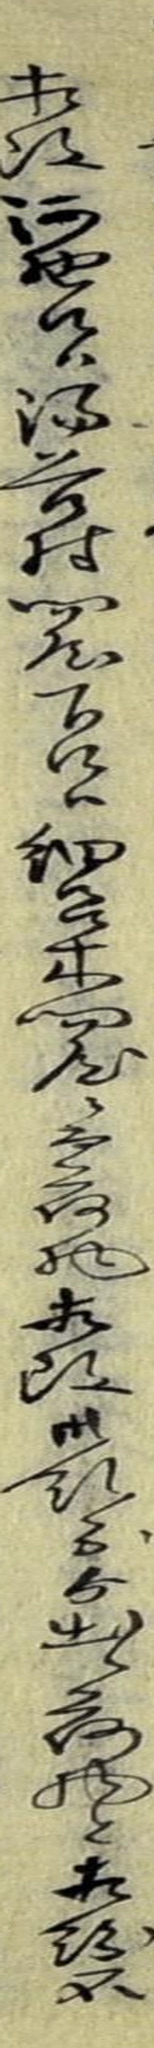相改河野口ハ湯谷村問屋下口ハ細呂木問屋ニ而荷物相改御領分ゟ出候荷物と相紛不
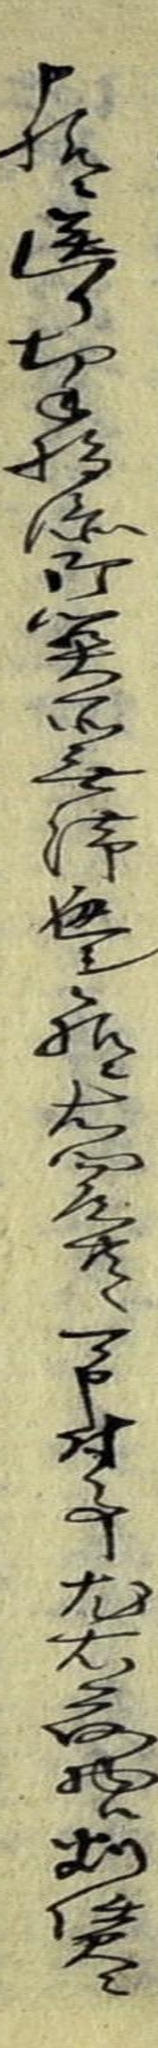申様ニ送り切手指添御関所無滞通シ候様ニ右問屋共へ可申付事尤右荷物ハ判賃ニ
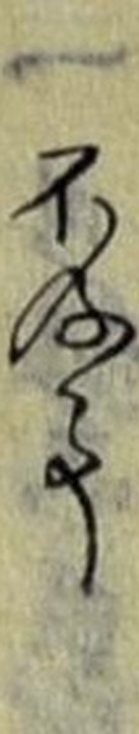不及事
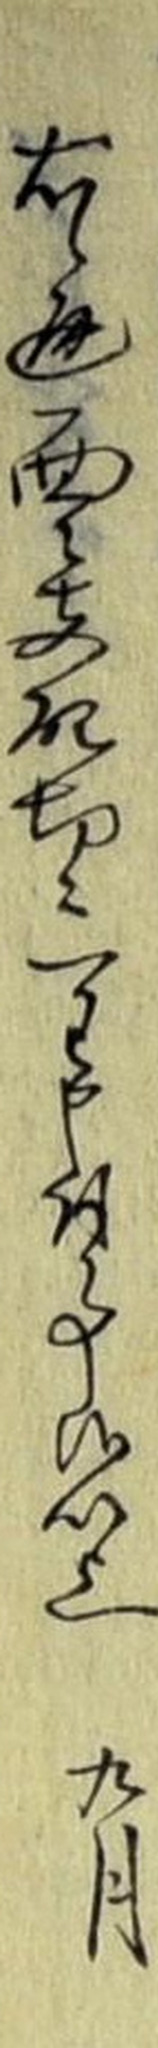右之通面々支配切ニ可被申付事候以上九月
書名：命令之部 一
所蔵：福井県文書館 Fukui Prefectural Archives
